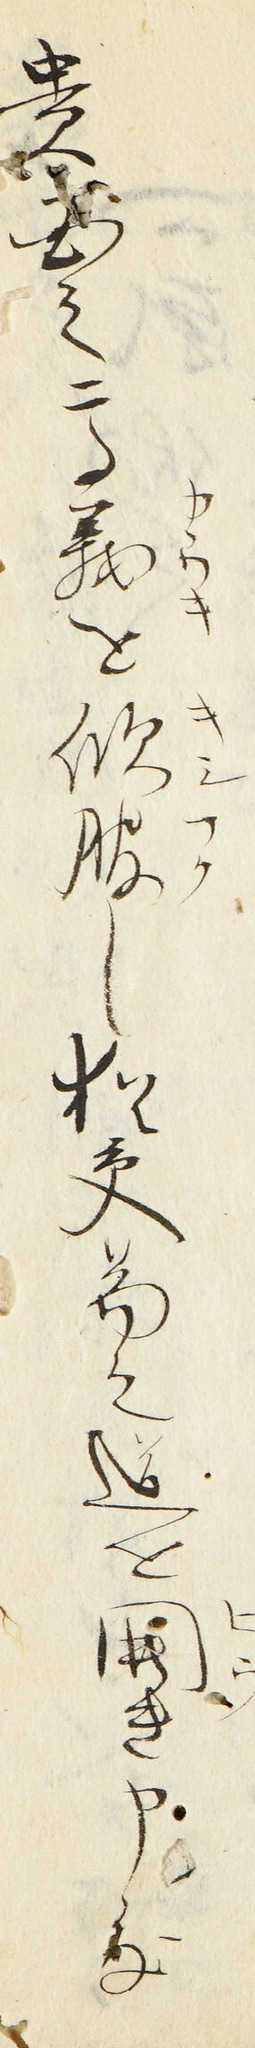貴国之高義を欣服し猶更易之道を開き申度

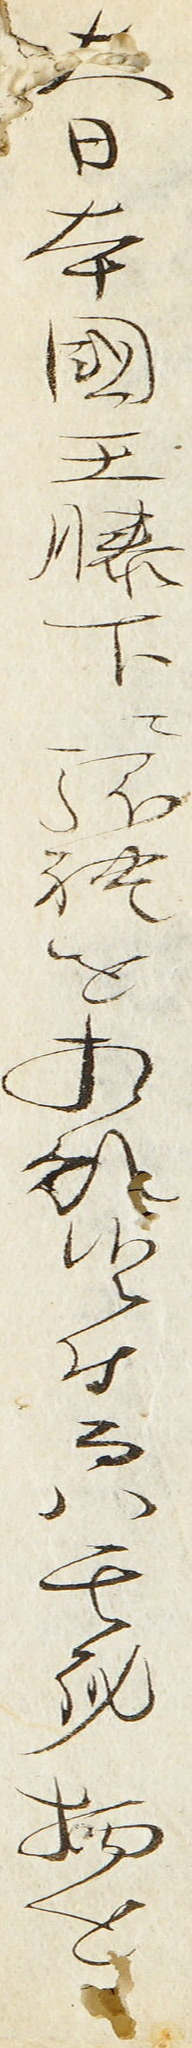大日本国王膝下に拝礼を相願候に付ては其身柄を
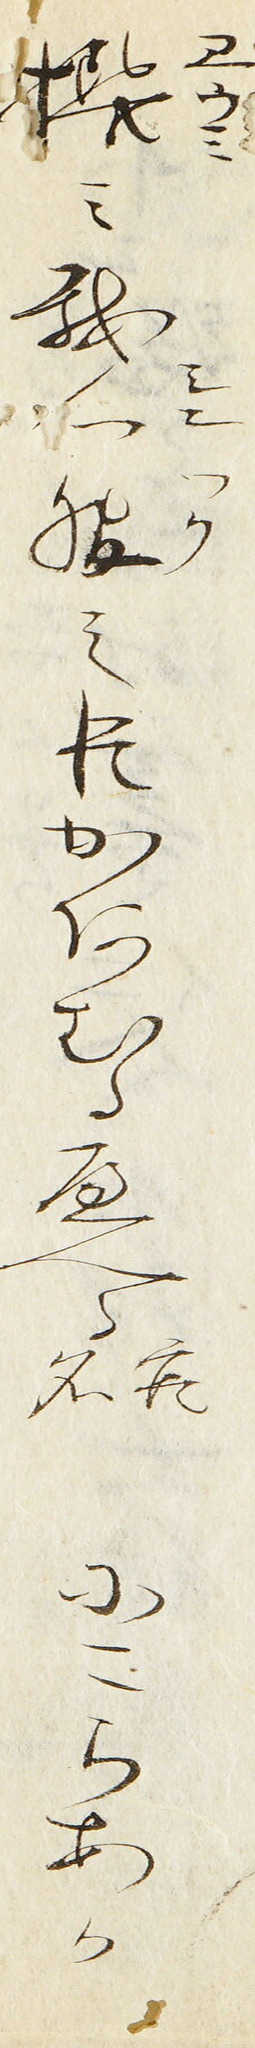撰み我心服之臣かあむるへへる官名にこらあか
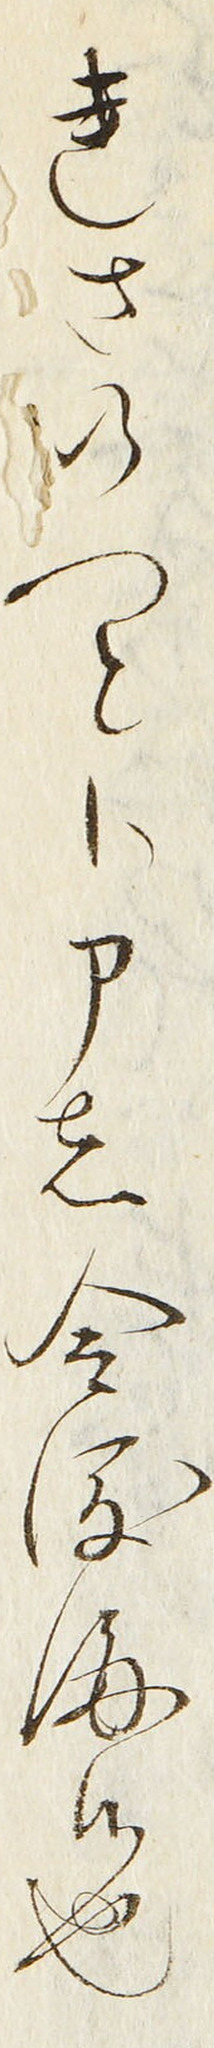きさのつとは申者今渡海候也
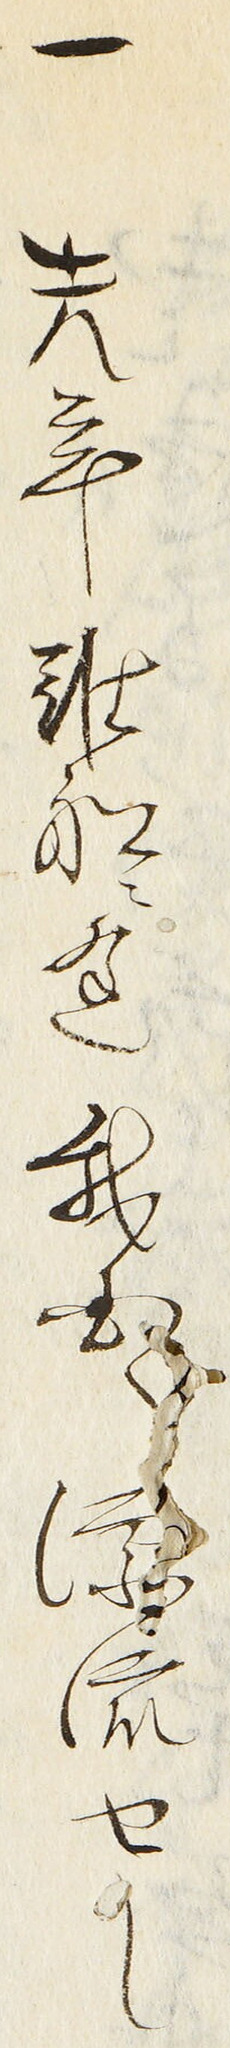一先年難舟に逢我国へ漂流せし
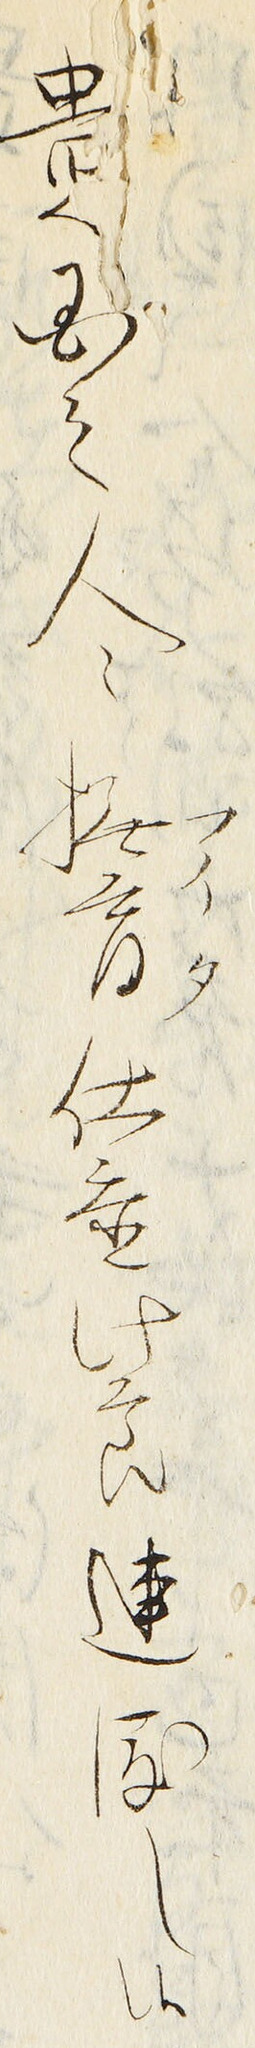貴国之人々撫育仕置此節連渡し候
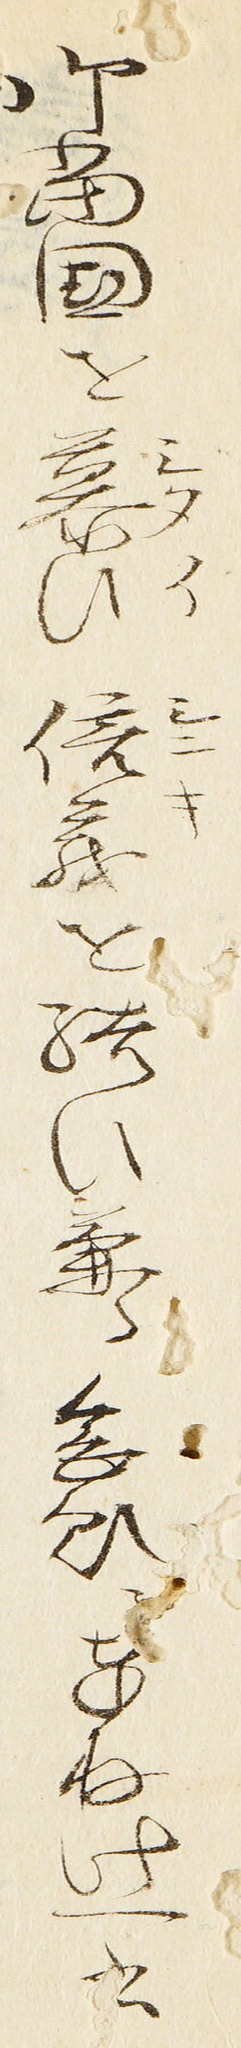御当国を慕ひ信義を結ひ兼て念願に奉存候一書
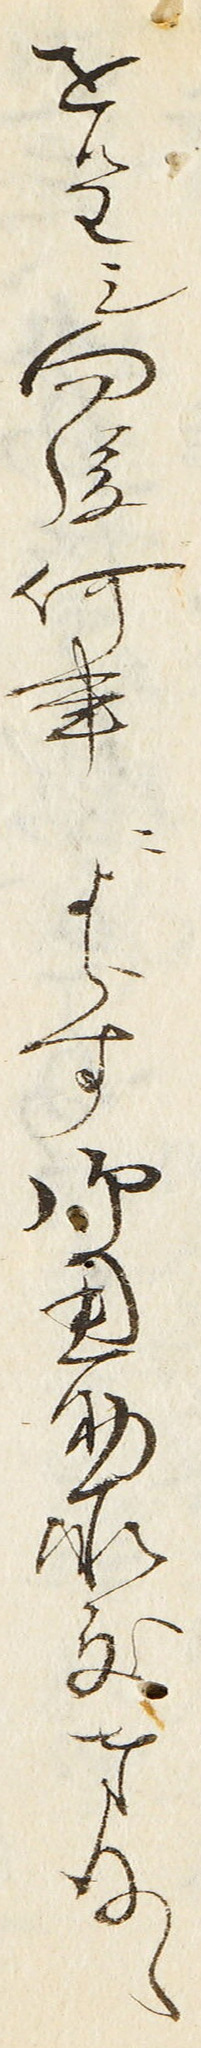を呈し向後何事によらす御用筋承度奉存候
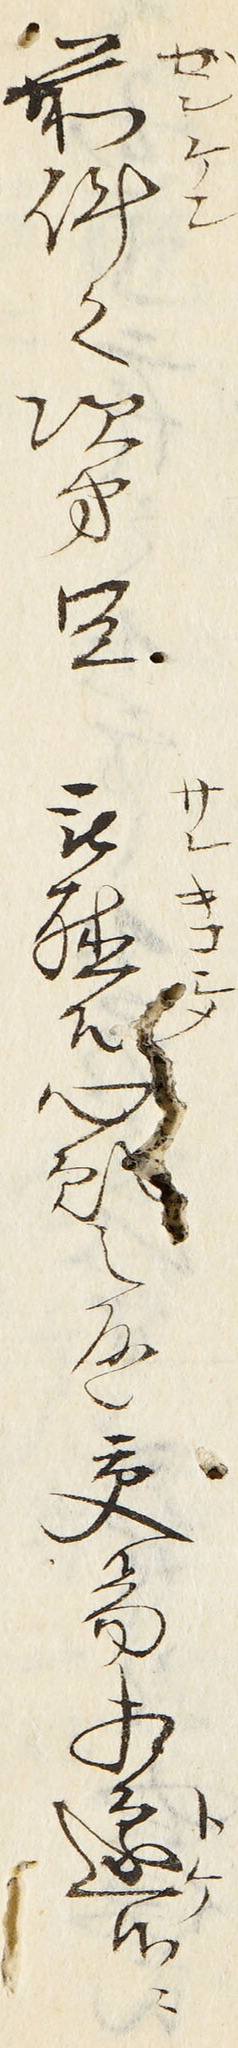前件之次第宜被殖召心願之通交易相遂候に
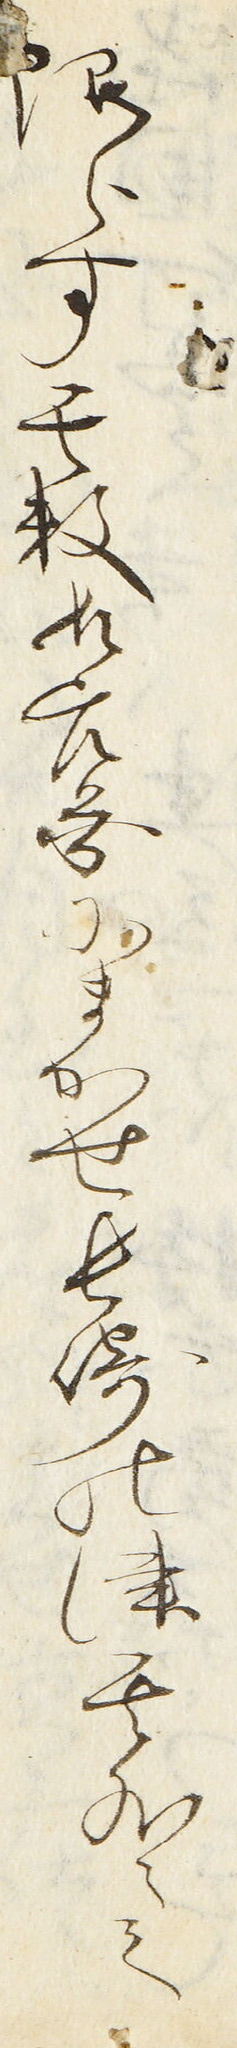限らす其数御差図にまかせ長崎の津其外々之
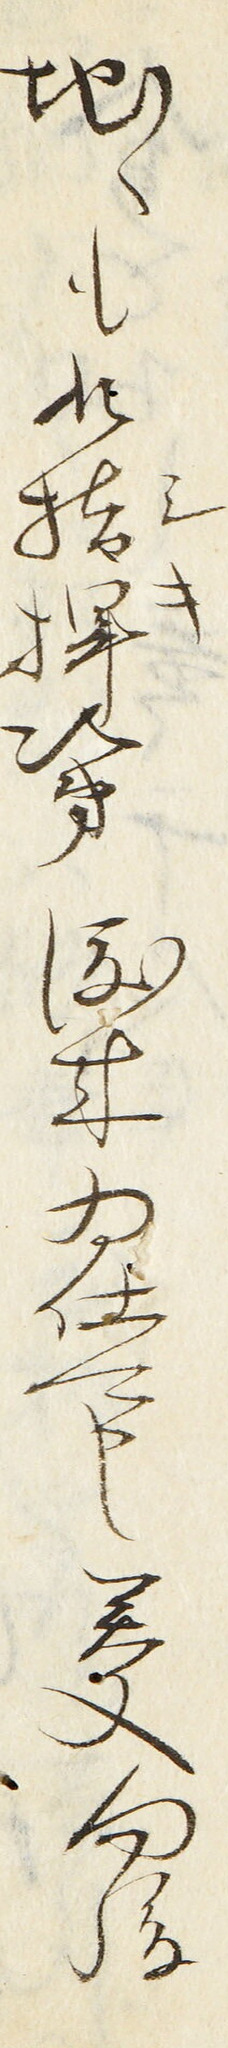地へも御指揮次第渡来為仕可申候若又向後
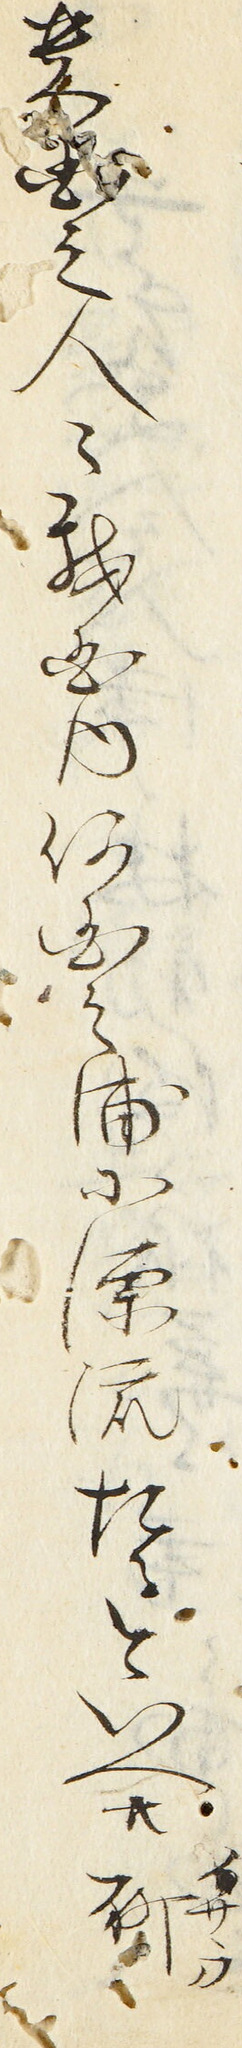貴国之人々我国内何国之浦に漂流たるといへ共聊

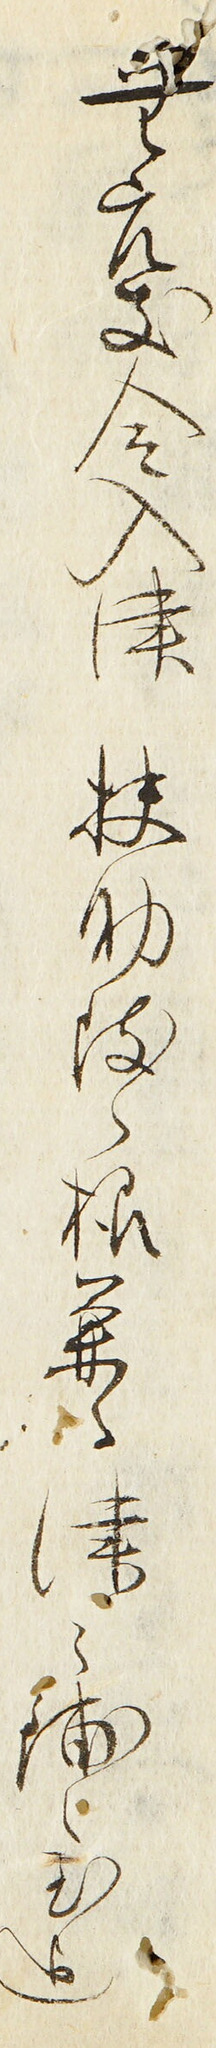無差支会入津扶助致候様兼て津々浦々至迄
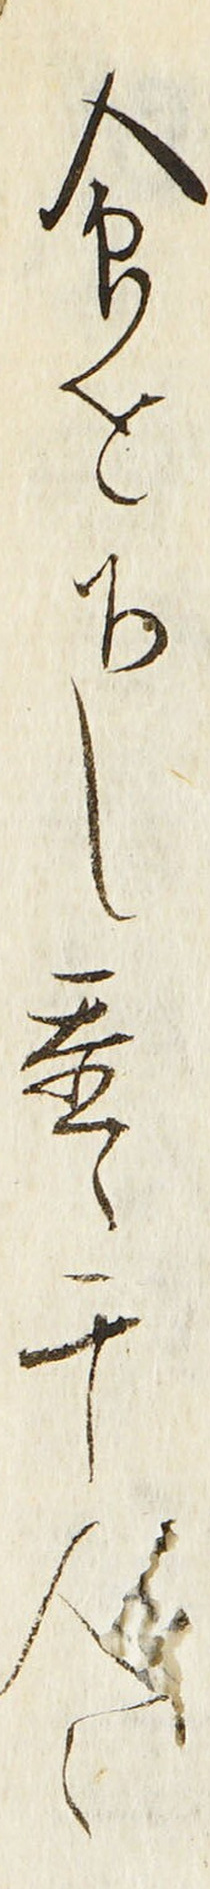命を下し置候其人之
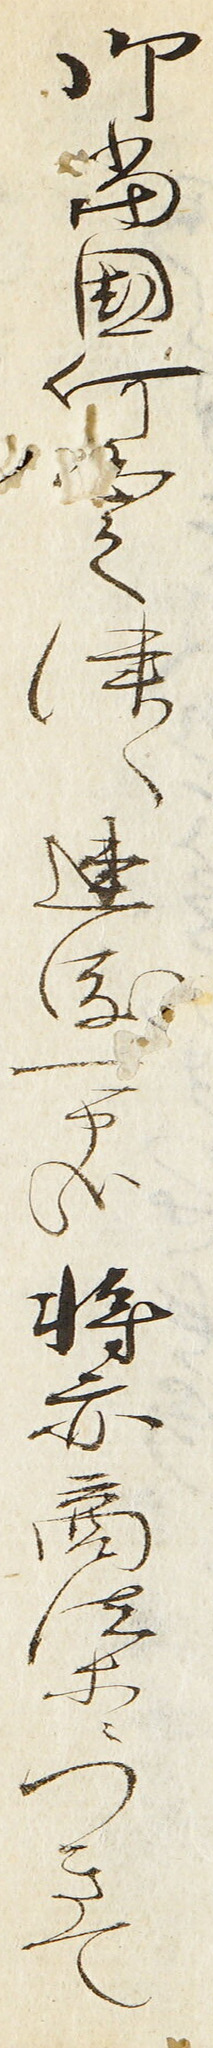御当国何国之津へ連渡可申哉将亦商法等につきて
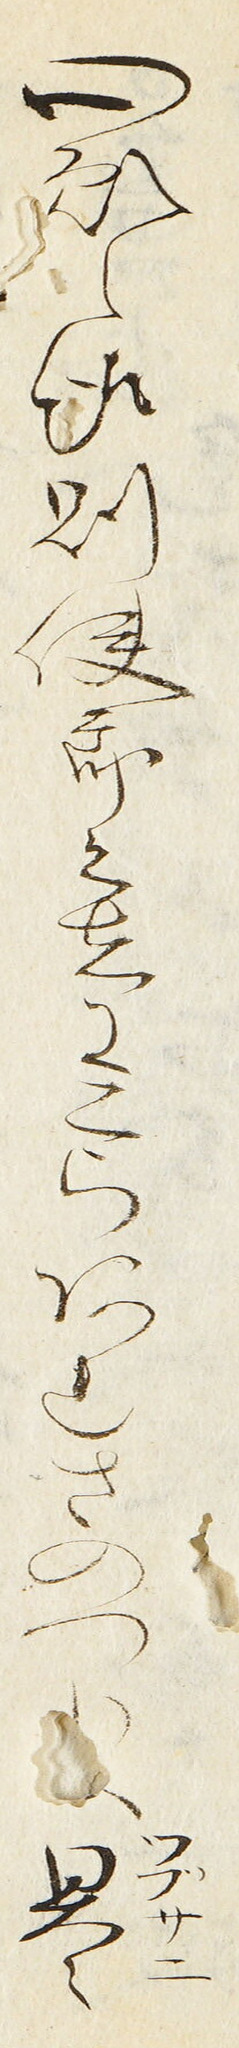心願之趣則使節之者にこらあれさのつとへ具に
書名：魯西亜国舟渡来始末并日本流漂人異国遍歴之話（西洋欧羅巴州之内一）
